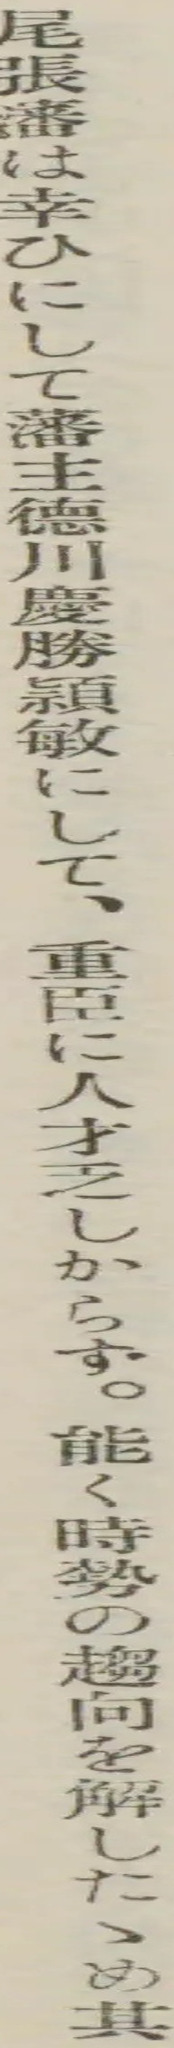尾張藩は幸ひにして藩主徳川慶勝穎敏にして、重臣に人才乏しからず。能く時勢の趣向を解したゝめ其
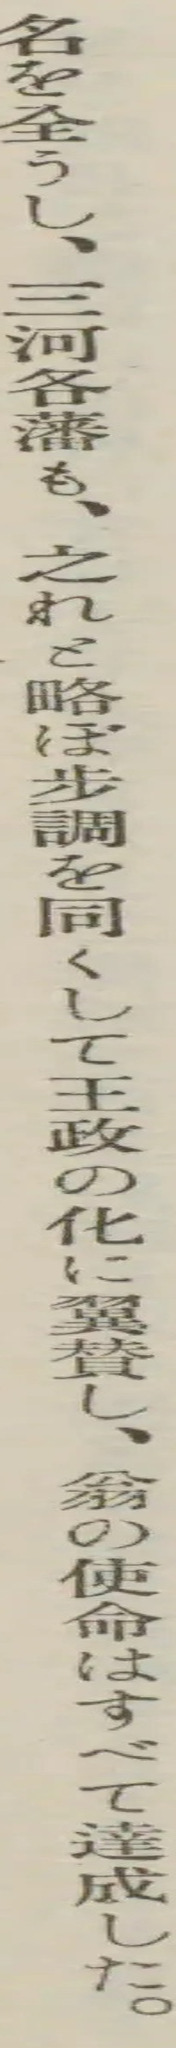名を全うし、三河各藩も、之れと略ぼ歩調を同くして王政の化に翼賛し、翁の使命はすべて達成した。
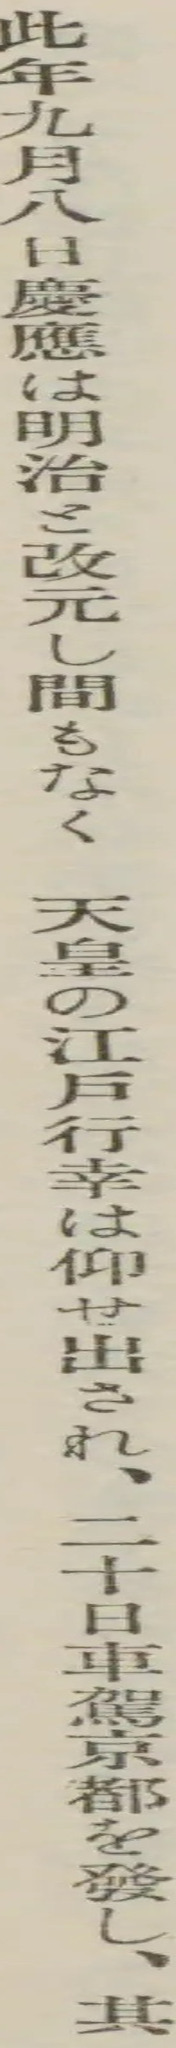此年九月八日慶應は明治と改元し間もなく天皇の江戸行幸は仰せ出され、二十日車駕京都を発し、其
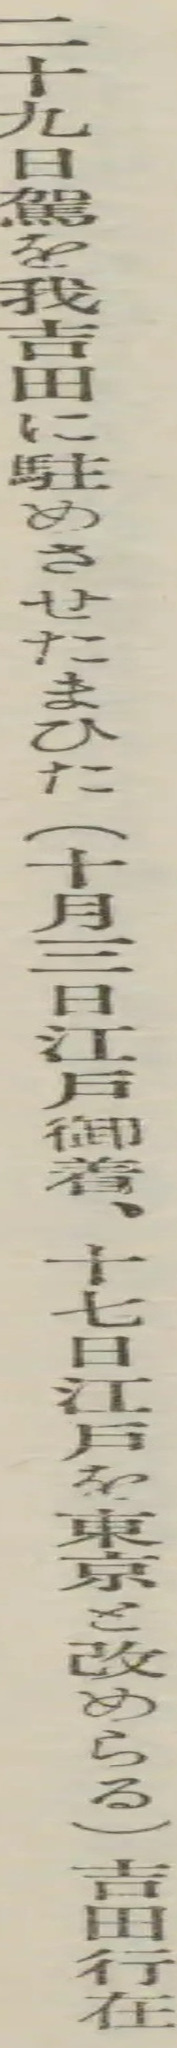二十九日駕を我吉田に駐めさせたまひた(十月三日江戸御着、十七日江戸を東京と改めらる)吉田行在
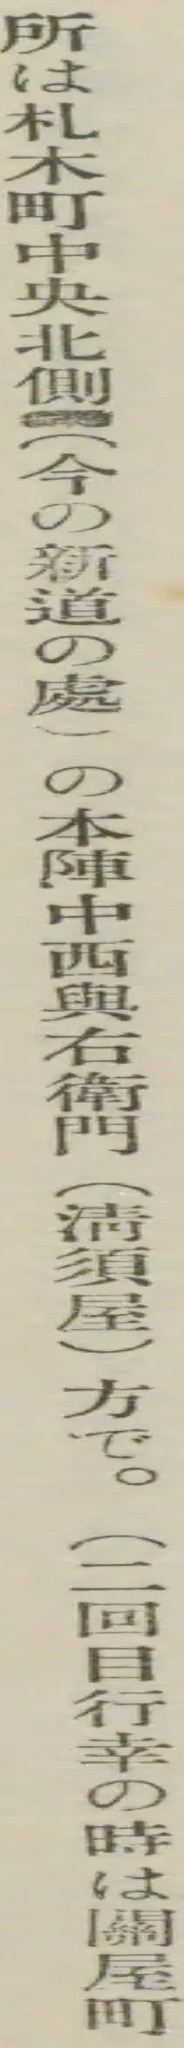所は札木町中央北側(今の新道の処)の本陣中西與右衛門(清洲屋)方で。(二回目行幸の時は關尾町
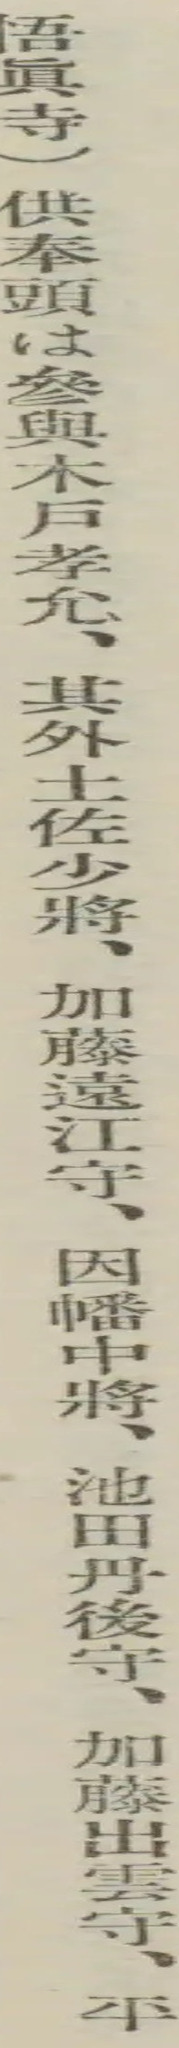悟眞寺)供奉頭は参与木戸孝允、其外土佐少将、加藤遠江守、因幡中将、池田丹後守、加藤出雲守、平
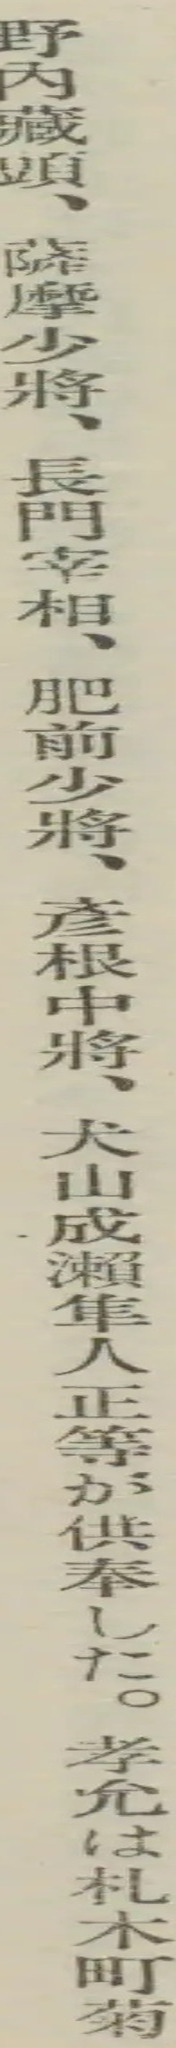野内藏頭、薩摩少将、長門宰相、肥前少将、彦根中将、犬山成瀬隼人正等が供奉した。孝允は札木町菊
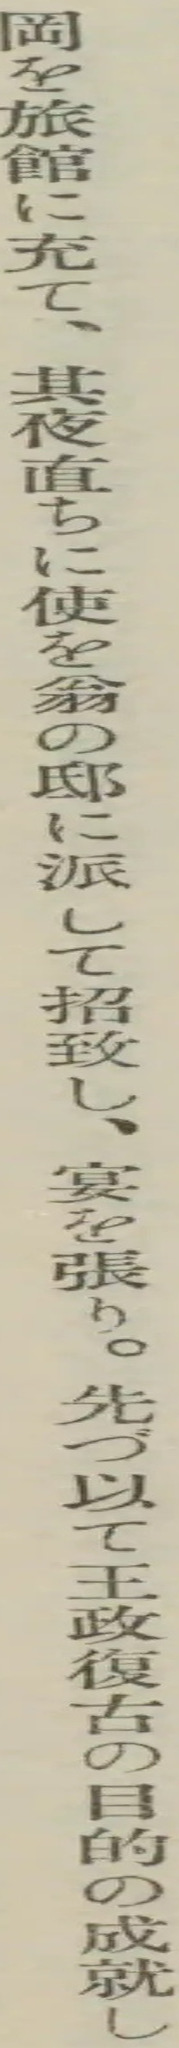岡を旅館に充て、其夜直ちに使を翁の邸に派して招致し、宴を張り。先づ以て王政復古の目的の成就し
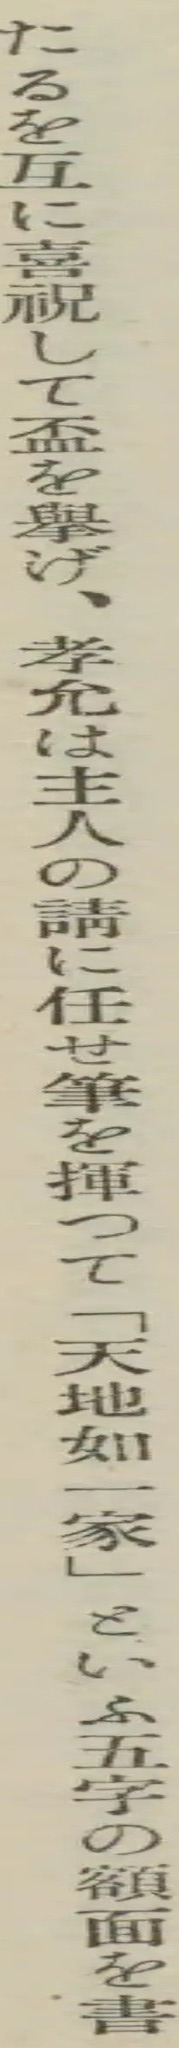たるを互に喜祝して盃を挙げ、孝允は主人の請に任せ筆を揮つて「天地如一家」といふ五字の額面を書
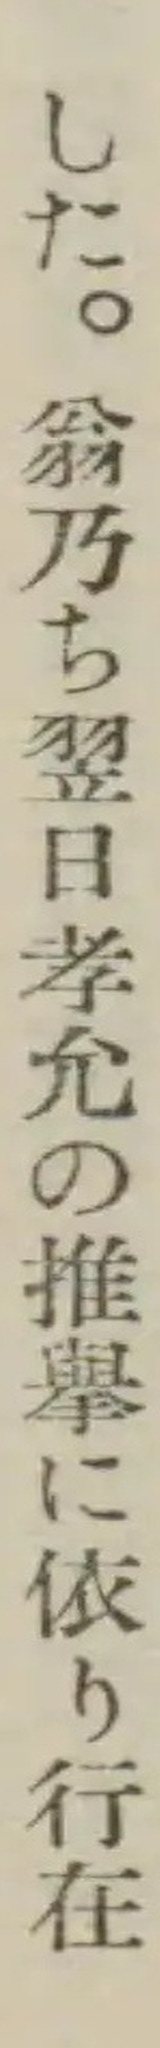した。翁乃ち翌日孝允の推挙に依り行在
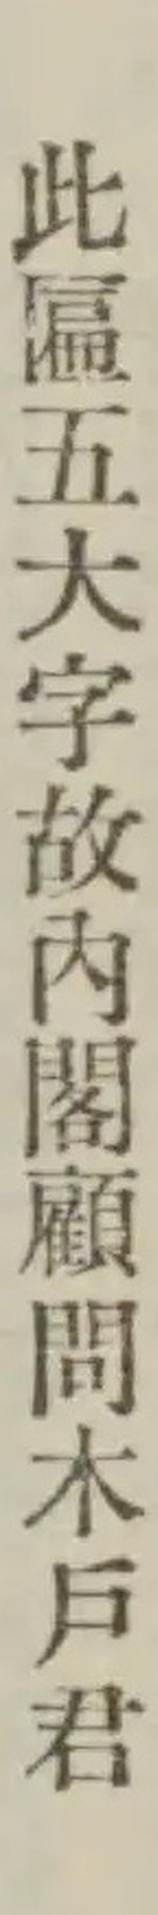此匾五大字故内閣顧問木戸君
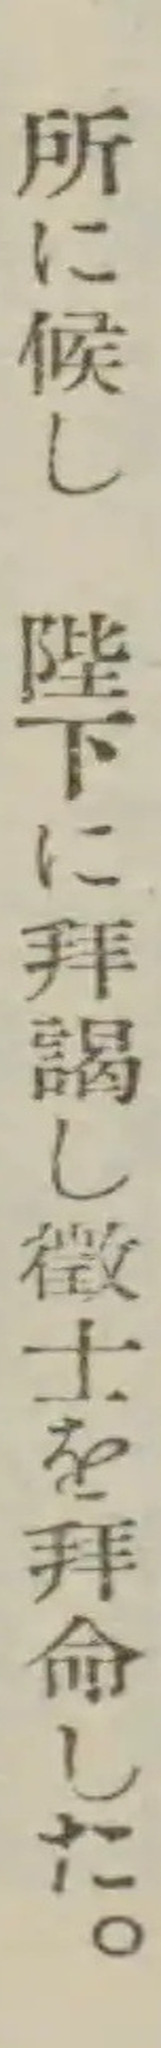所に候し陛下に拝謁し徴士を拝命した。
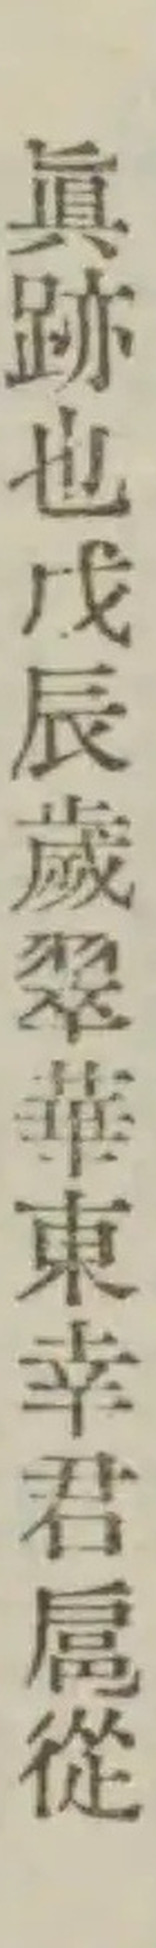眞跡也戊辰歳翠華東幸君扈従
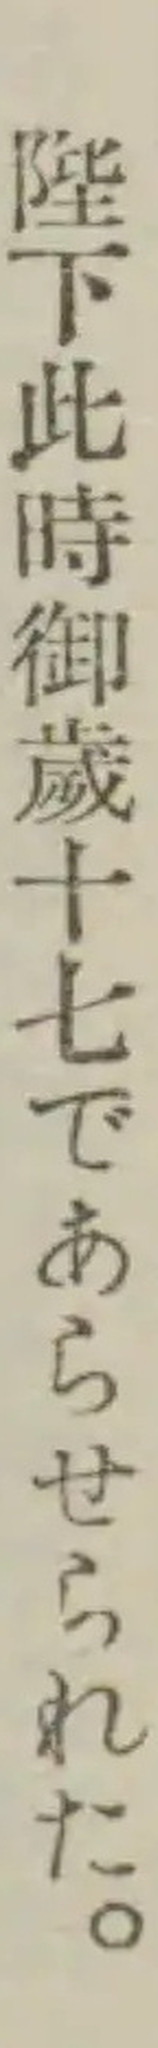陛下此時御歳十七であらせられた。
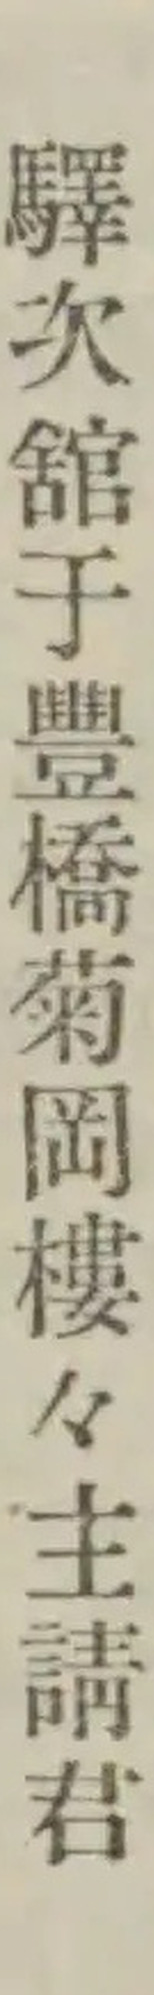驛次舘于豐橋菊岡樓々主請君
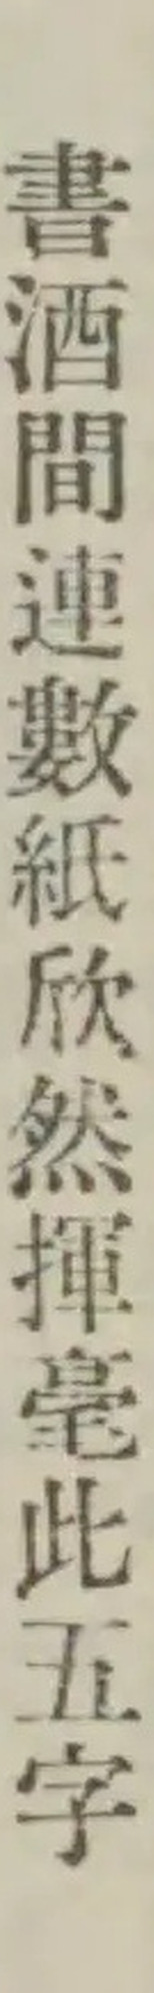書酒間連數紙欣然揮毫此五字
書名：小野湖山翁小伝
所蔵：国立国会図書館 National Diet Library, JAPAN
